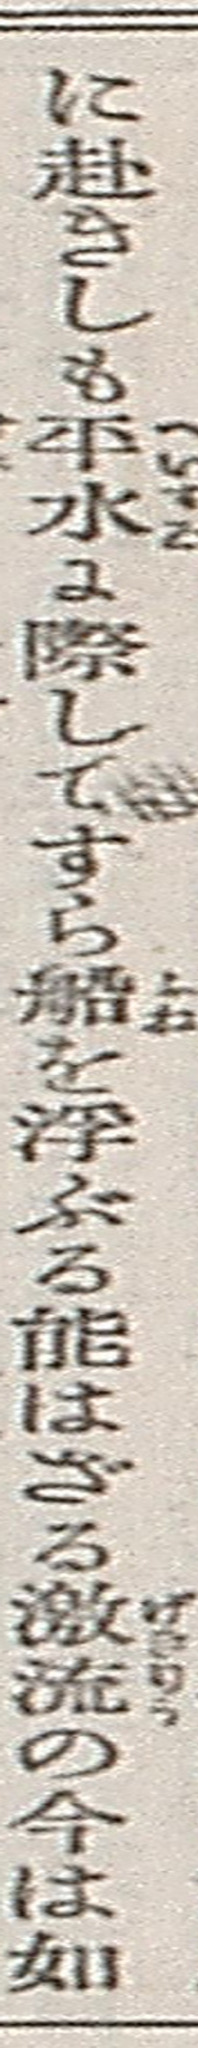に赴きしも平水に際してすら船を浮ぶる能はざる激流の今は如
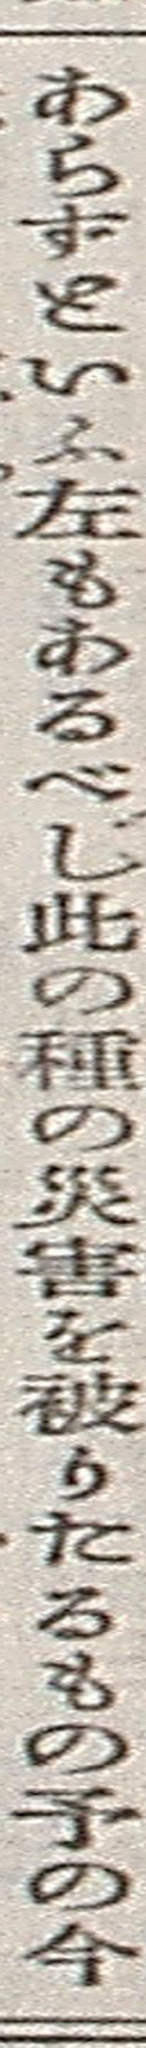あらずといふ左もあるべし此の種の災害を被りたるもの予の今
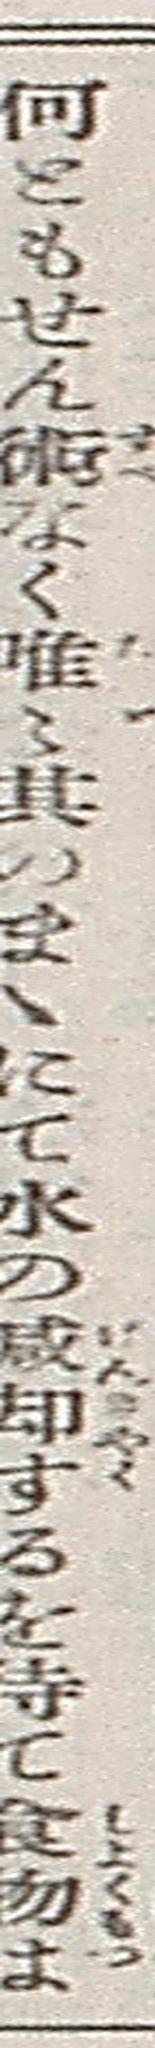何ともせん術なく唯々其のまゝにて水の減却するを待て食物は
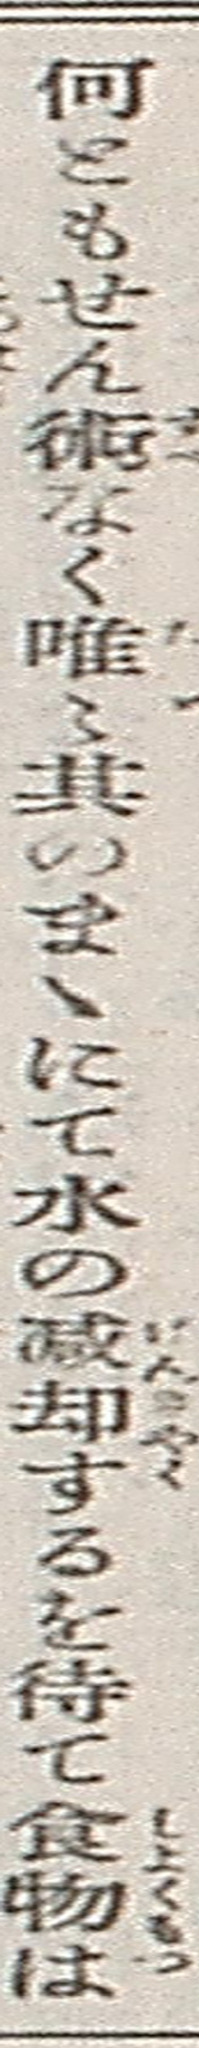何ともせん術なく唯々其のまゝにて水の減却するを待て食物は
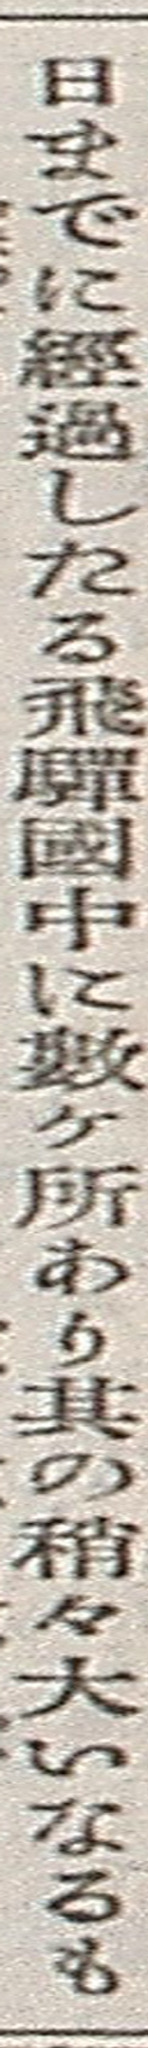日までに経過したる飛騨国中に数ヶ所あり其の稍々大いなるも
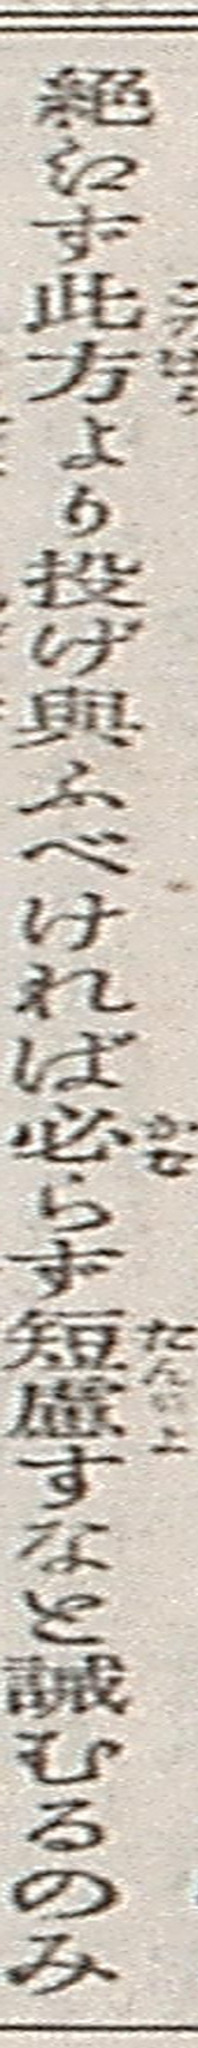絶えず此方より投げ輿ふべければ必らず短慮すなと誡むるのみ
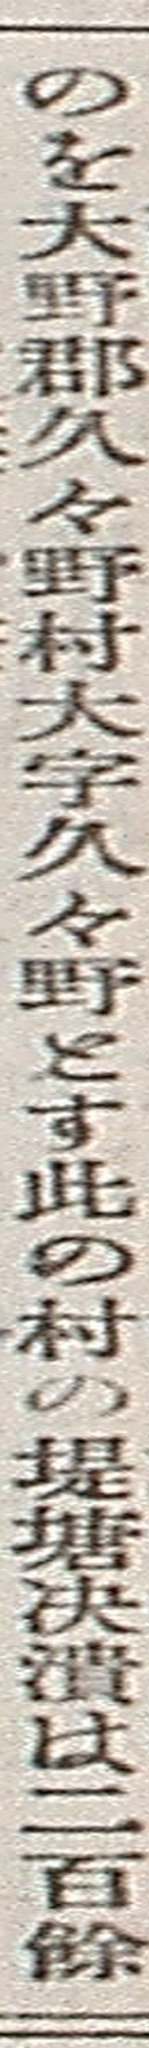のを大野郡久々野村大字久々野とす此の村の堤塘决潰は二百餘
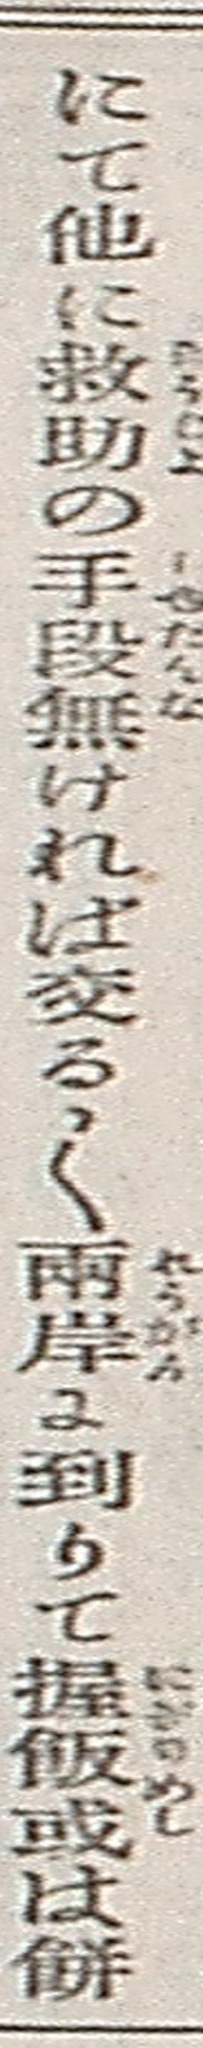にて他に救助の手段無ければ交る〳〵両岸に到りて握飯或は餅
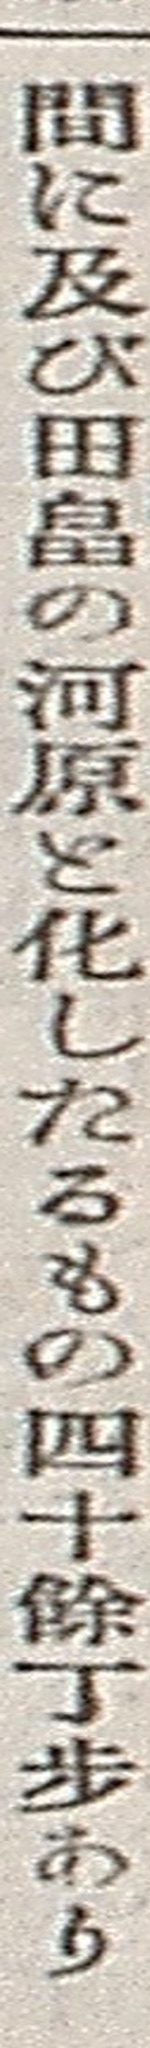間の及び田畠の河原と化したるもの四十餘丁歩あり

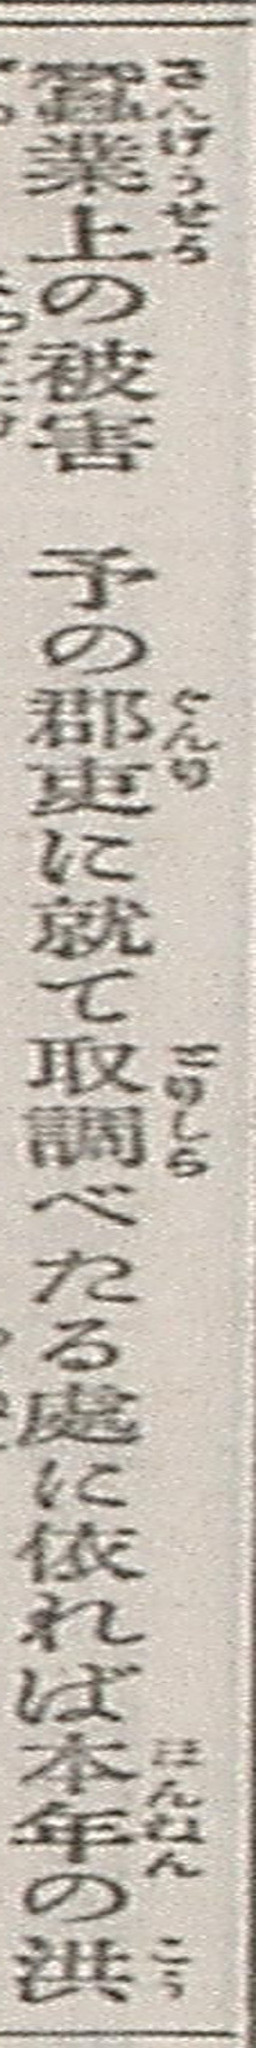蚕業上の被害予の郡吏に就て取調べたる処に依れば本年の洪
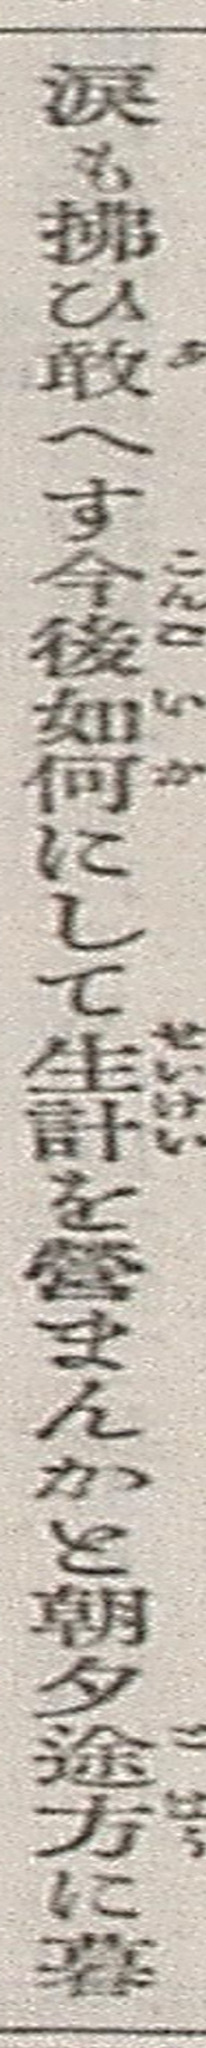涙も払ひ敢へず今後如何にして生計を営まんかと朝夕途方に暮
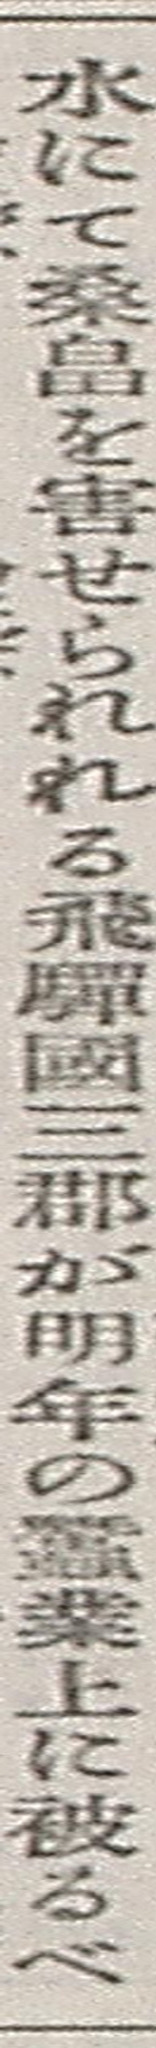水にて桑畑を害せられたる飛騨国三郡が明年の蚕業上に被るべ
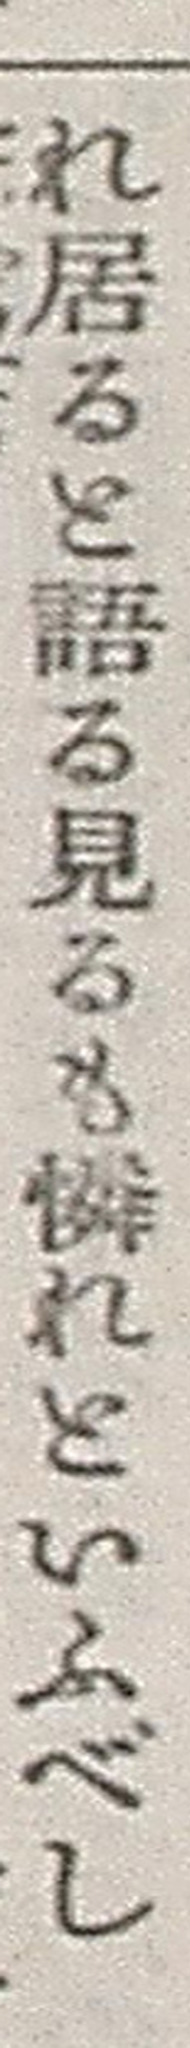れ居ると語る見るも憐れといふべし
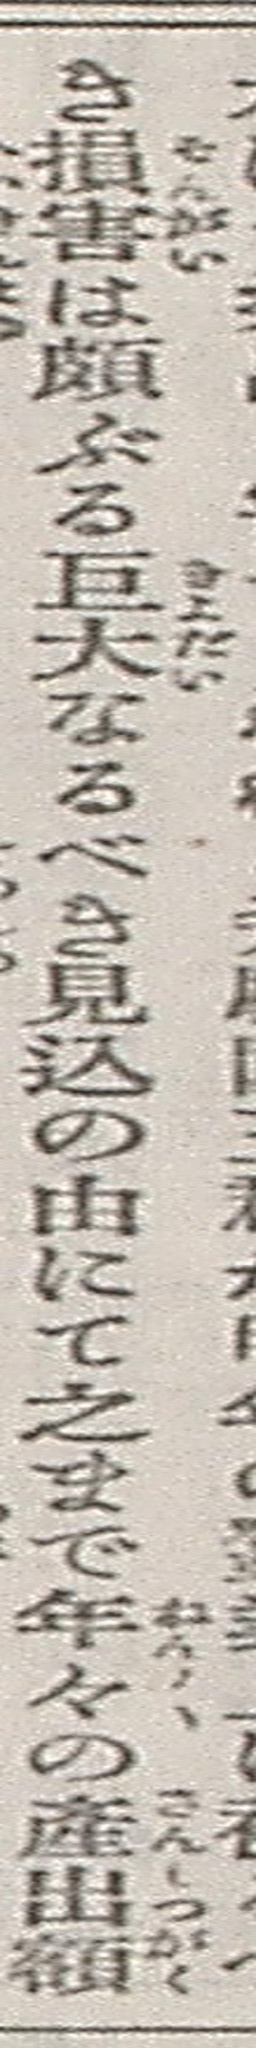き損害は頗ぶる巨大なるべき見込の由にて之まで年々の産出額
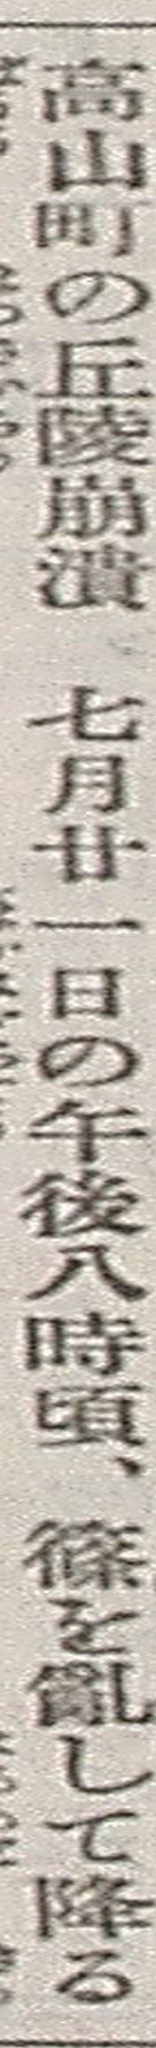高山町の丘陵崩潰七月廿一日の午後八時頃、篠を乱して降る
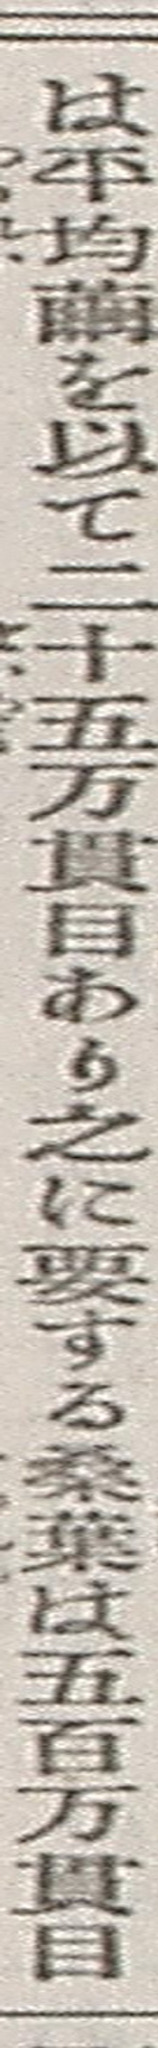は平均繭を以て二十五万貫目あり之に要する桑葉は五百万貫目
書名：風俗畫報臨時増刊第百二十八號　洪水被害録（下）
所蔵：東京大学地震研究所図書室 Earthquake Research Institute Library, The University of Tokyo, JAPAN
